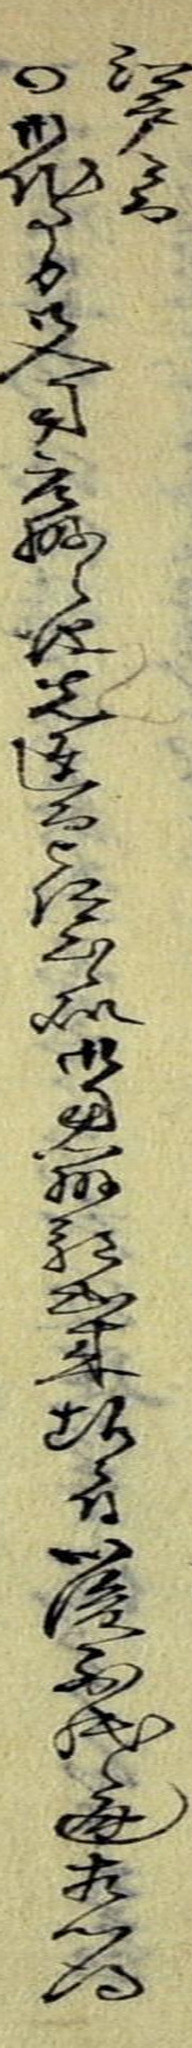○御作事方御入用取扱之儀先達而被仰出候処御用弁難出来趣ニ付以後別紙之通相心得
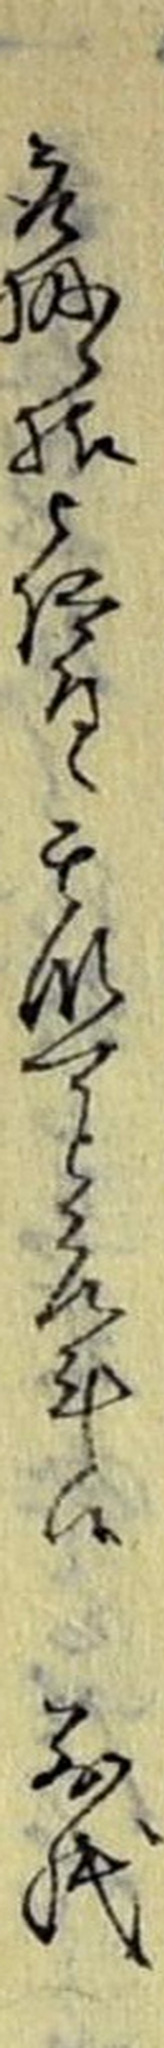取扱候様被仰付候其段可被取計候別紙
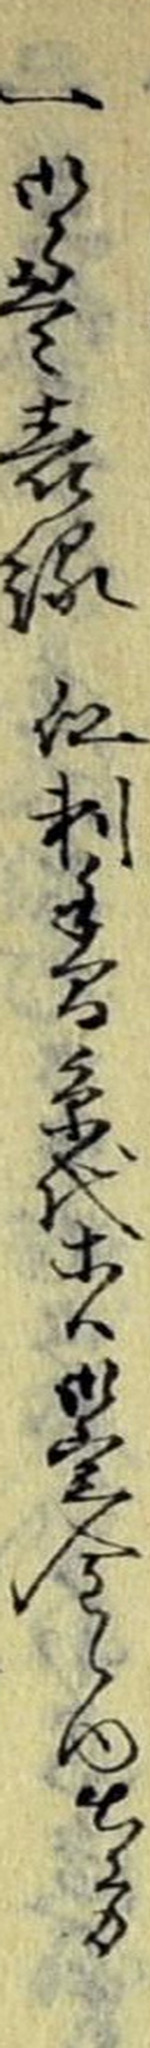一御畳表縁但刺手間糸代等ハ御定金之内出方
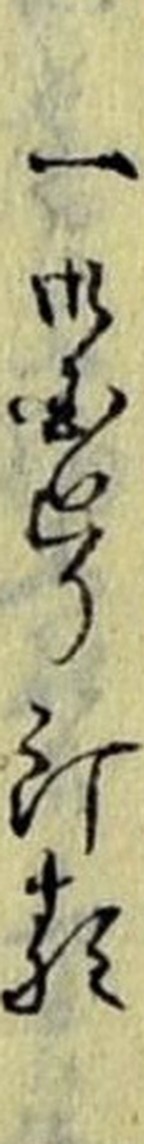一御国廻り釘類
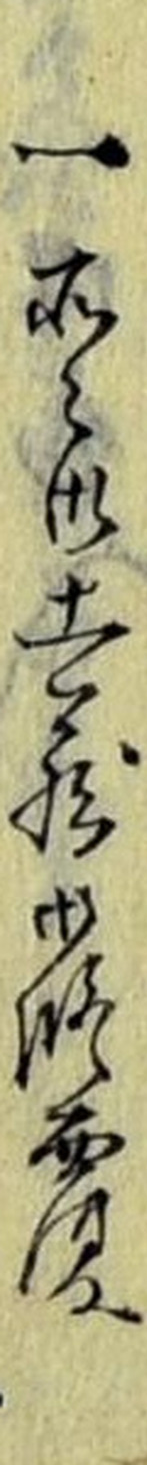一所々御土蔵御修覆
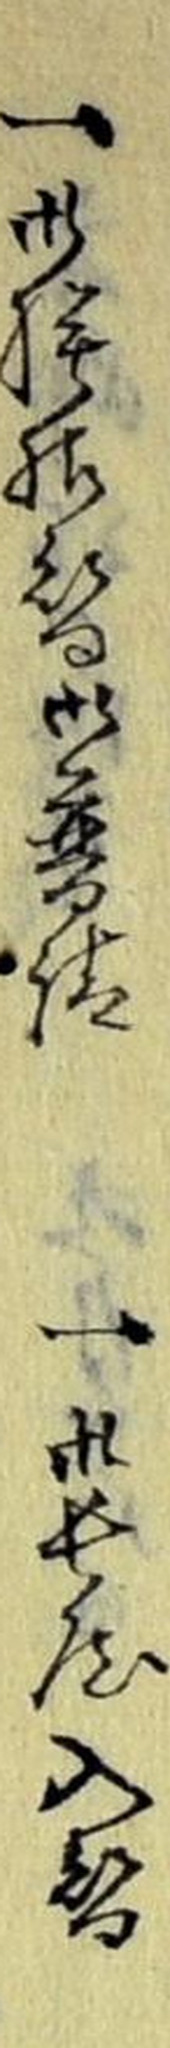一御模様替御普請一御長屋入替
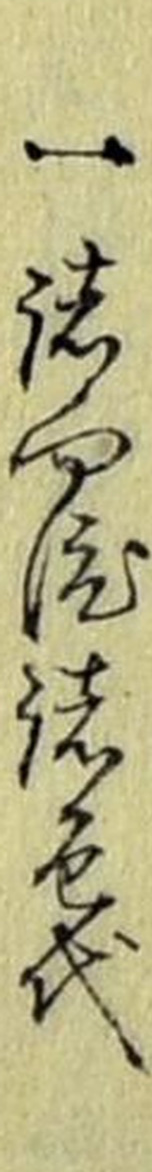一諸向渡諸色代

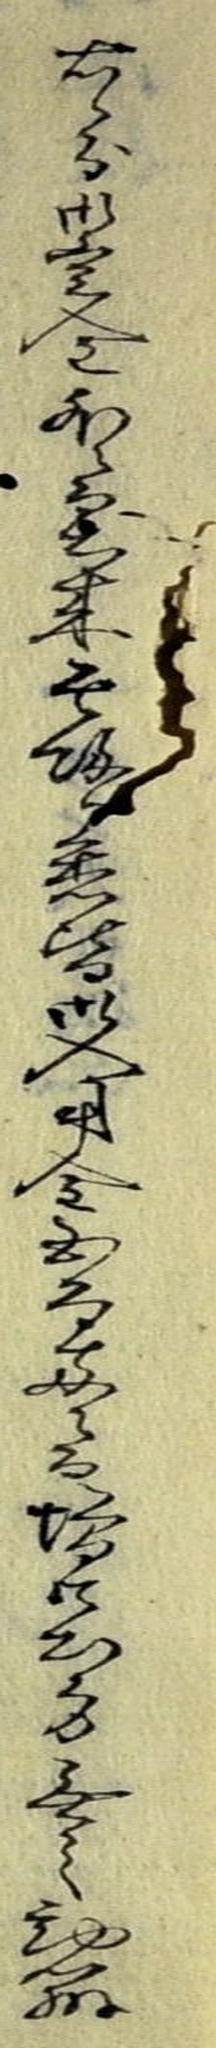右之分御定金外ニ而出来其余り悉皆御入用金五百両ニ而増口出方無之勘弁
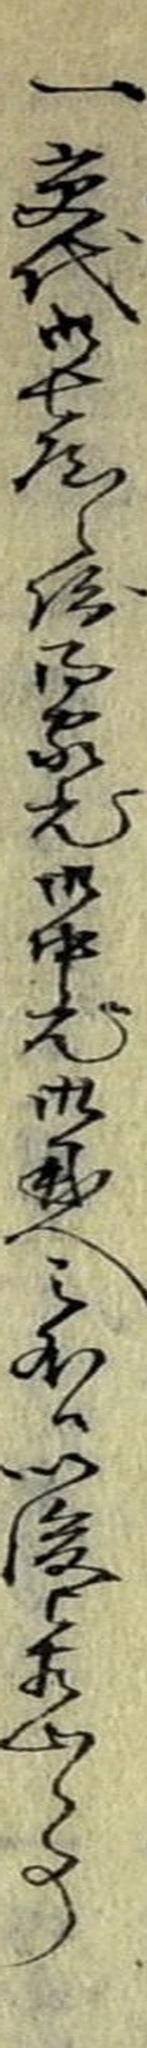一交代御長屋之儀御家老御中老御用人之外ハ以後被相止事
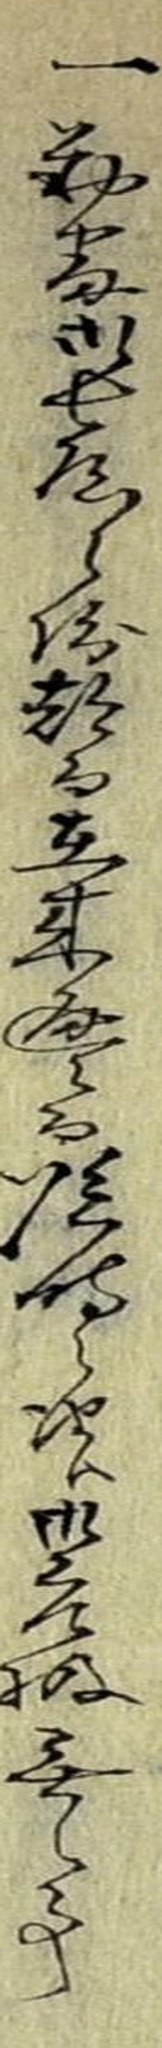一勤番御長屋之儀都而在来通ニ而臨時之儀ハ御取扱無之事
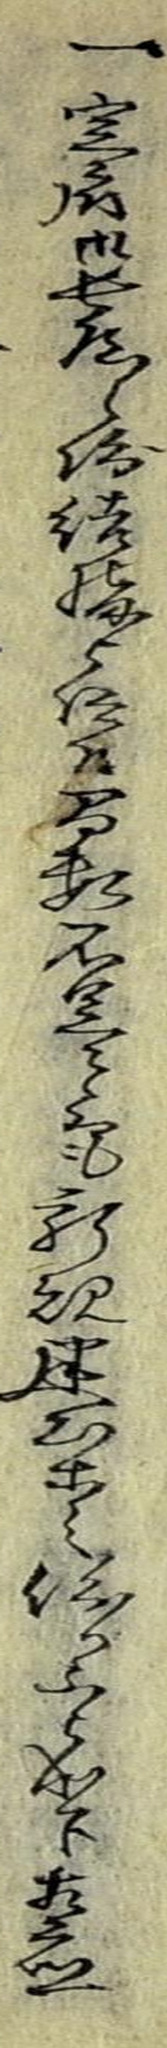一定府御長屋之儀結構被仰付間数不足ニ候而も新規建出等之儀ハ不被成下相応
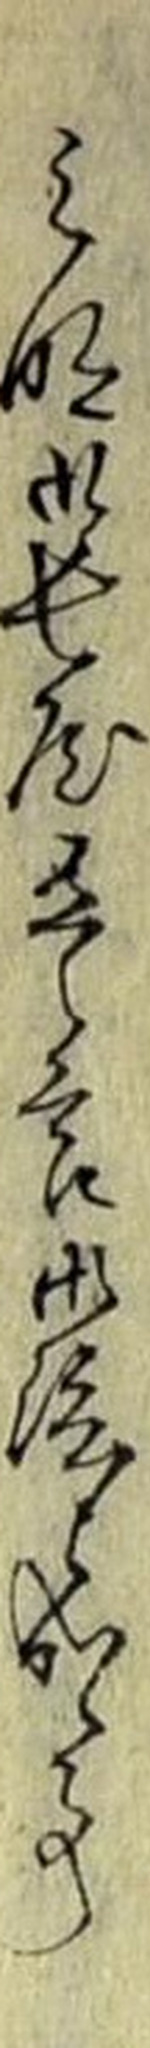之明御長屋有之節御渡被成候事
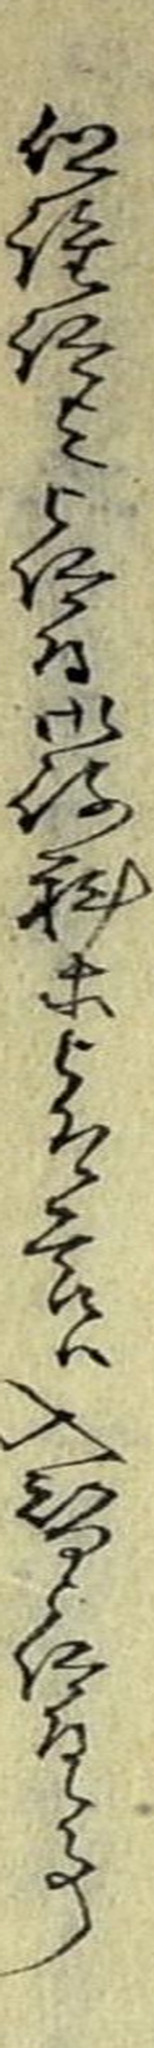但誰跡与被仰付御役料等被下候節ハ入替被仰付候事
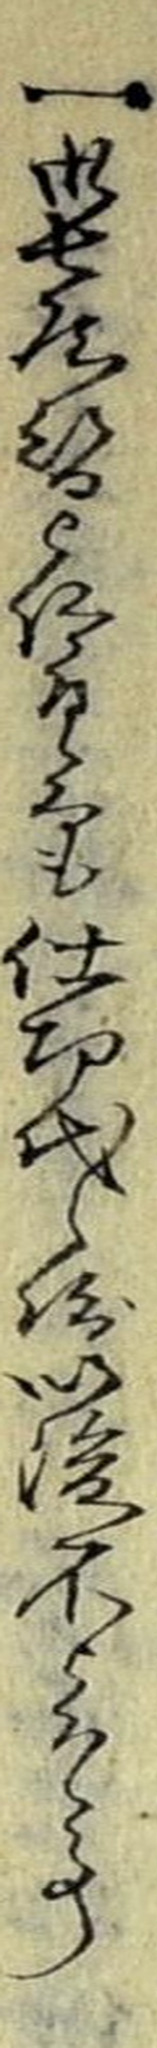一御長屋替被仰付候而も仕切代之儀以後不被下候事
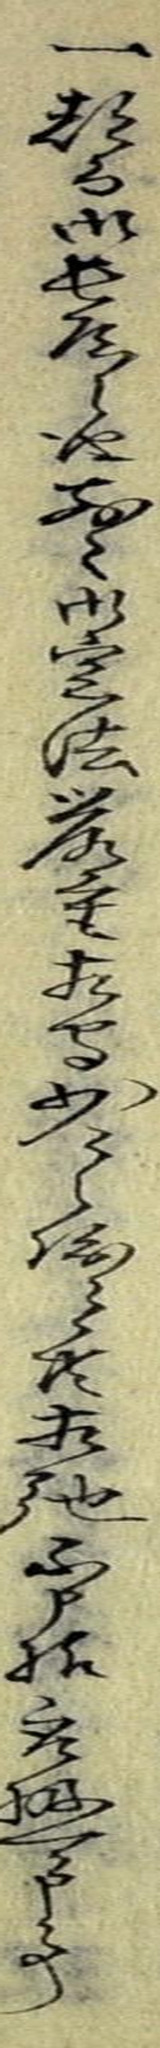一都而御長屋之儀前々御定法厳重相守少々之儀ニ候共相弛不申様取扱可申事
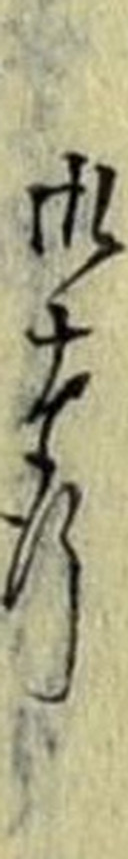御奉行
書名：命令之部 五
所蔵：福井県文書館 Fukui Prefectural Archives
